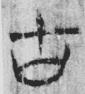古（故）
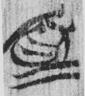爲
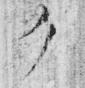人
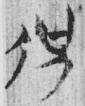○（兄）
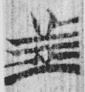者
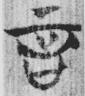言
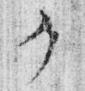人
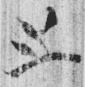之
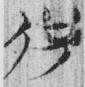○（兄）
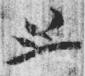之
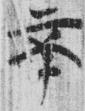不
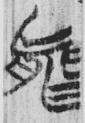能
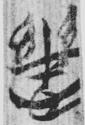○（慈）
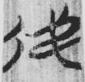俤（弟）
